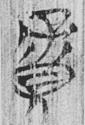賲（保）
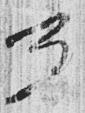乃
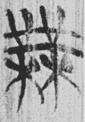無
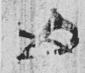凶
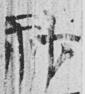○（災）
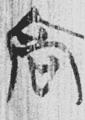高
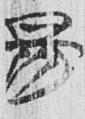昜（陽）
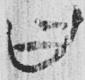曰
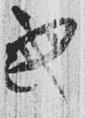母
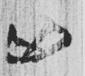凶
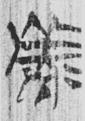備（服）
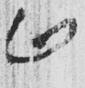㠯（以）
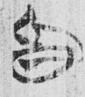亯（享）
